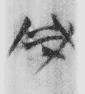凡
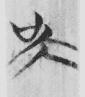吳
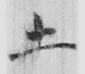土
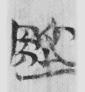地
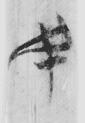民
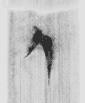人
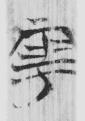𩁹
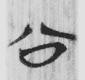公
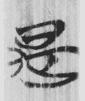是
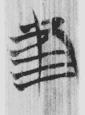𦘔
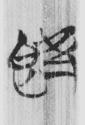既
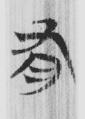有
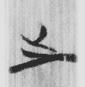之
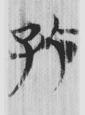孤
